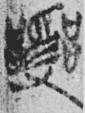○（亂）
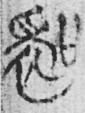○（萃）
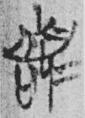若
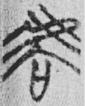○（號）
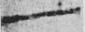一
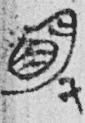斛（握）
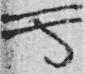于
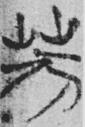○（笑）
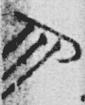勿
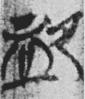卹（恤）
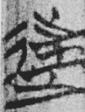往
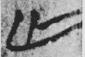亡
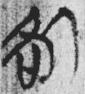咎
